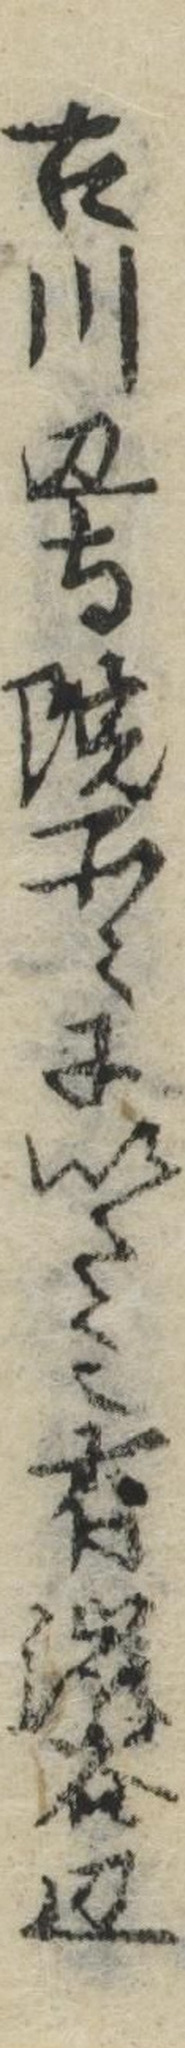古川辺寺院所〻にいたミ有渋谷辺
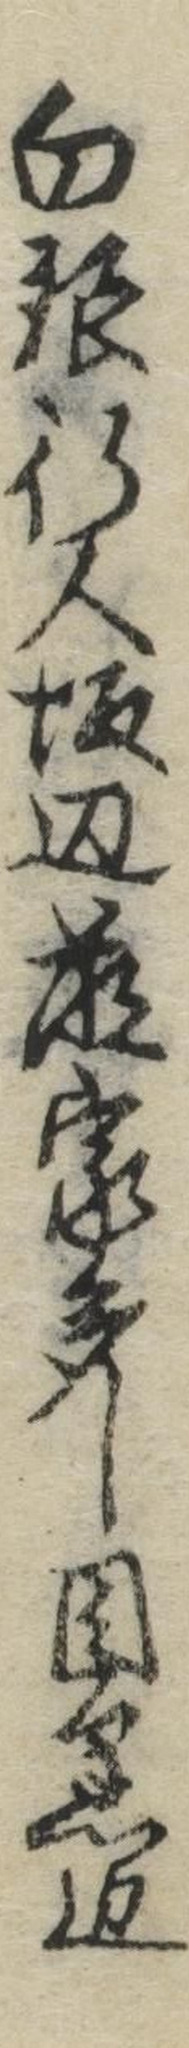白銀行人坂辺崩家多し目黒辺
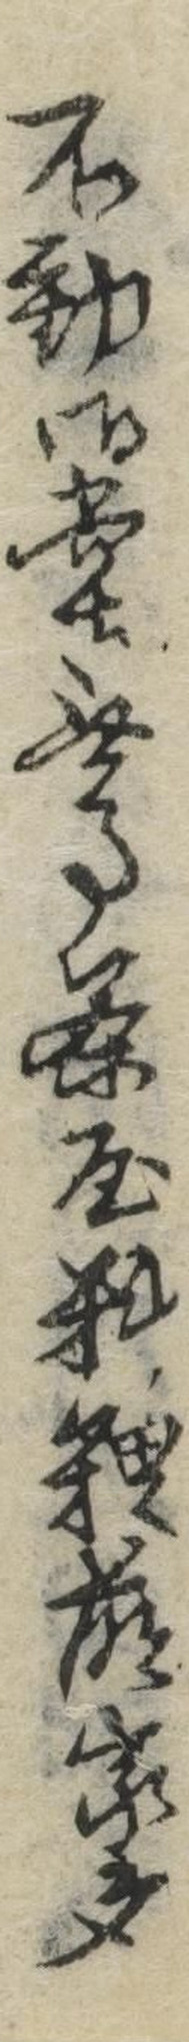不動御堂無事茶屋料裏崩家多
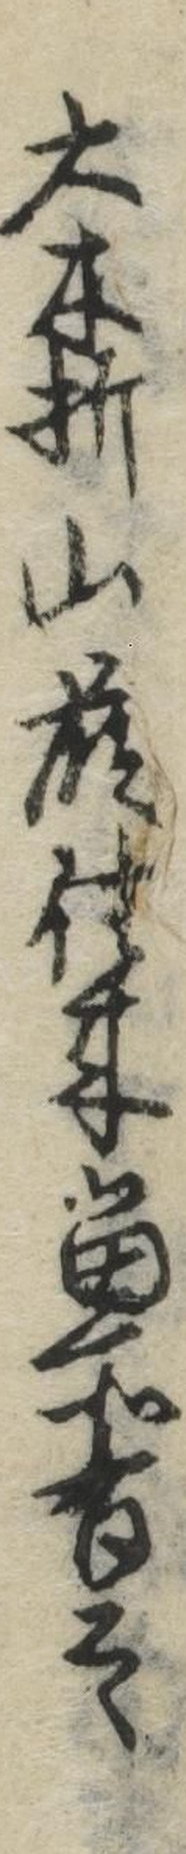大木折山崩往来留所有之
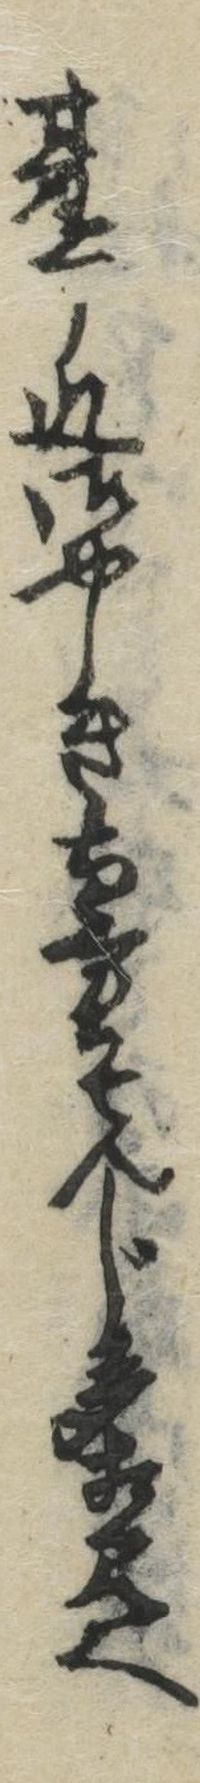臺ノ近御やしき両方そんじ多相見へ
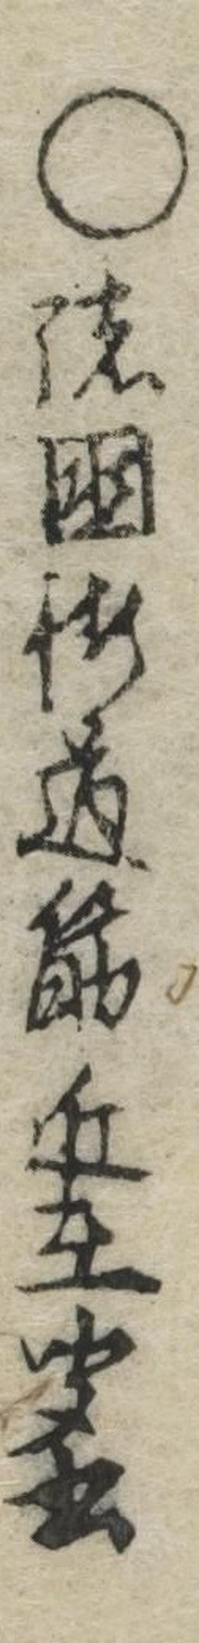〇諸国街道筋近在聞書
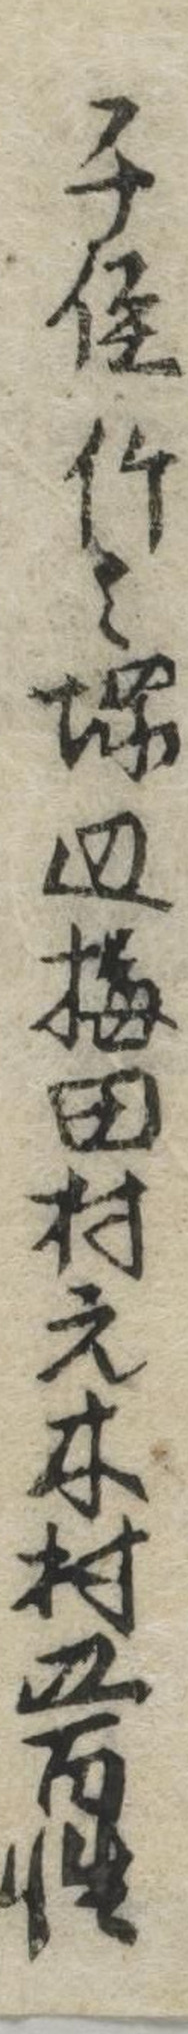千住竹之塚辺梅田村元木村辺百性
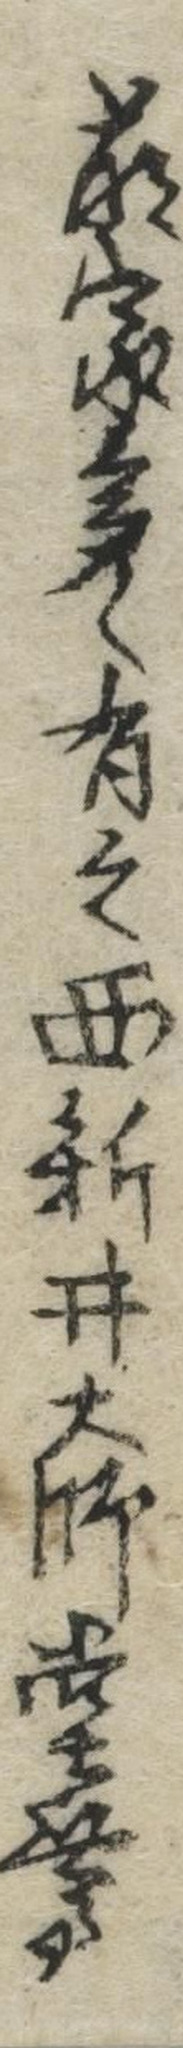崩家多く有之西新井大師堂無事
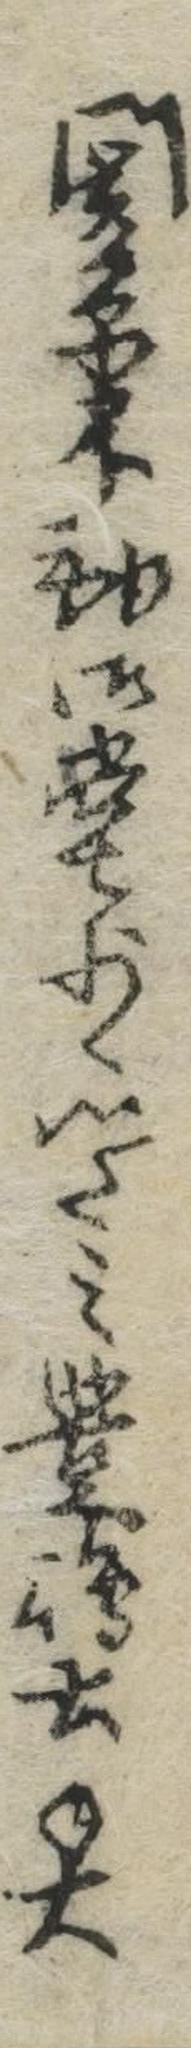関原不動御堂少〻いたミ豊嶋土手大
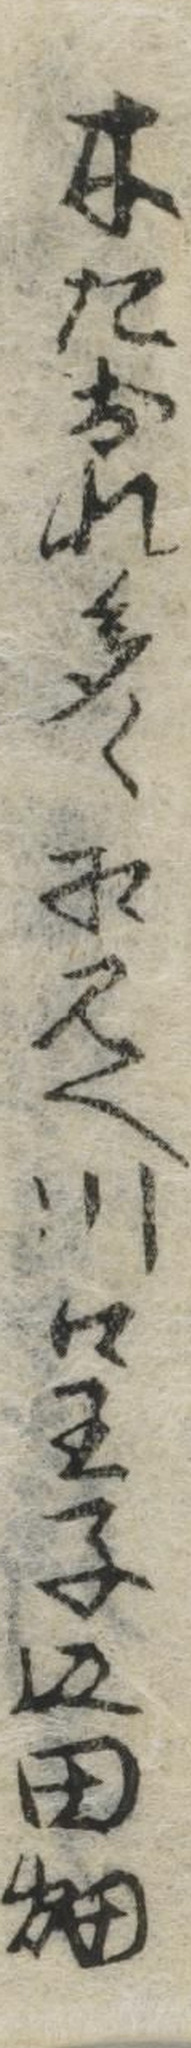木たおれ多く相見へ川口王子辺田畑
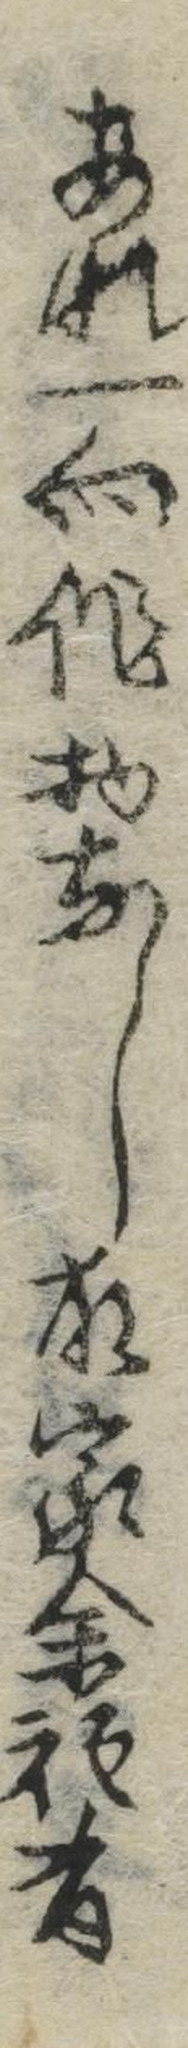あれ一向作物なし崩家余程有
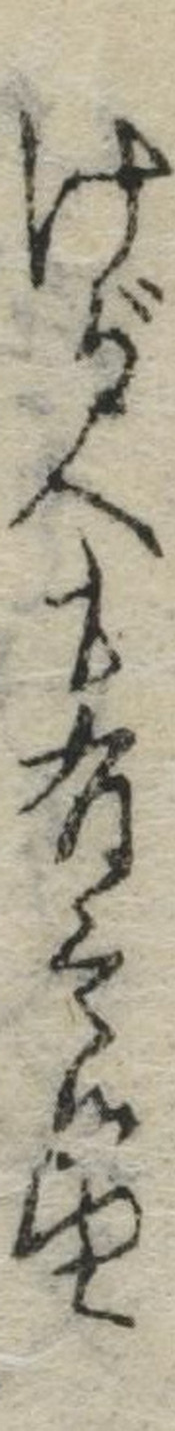けが人も有之候由
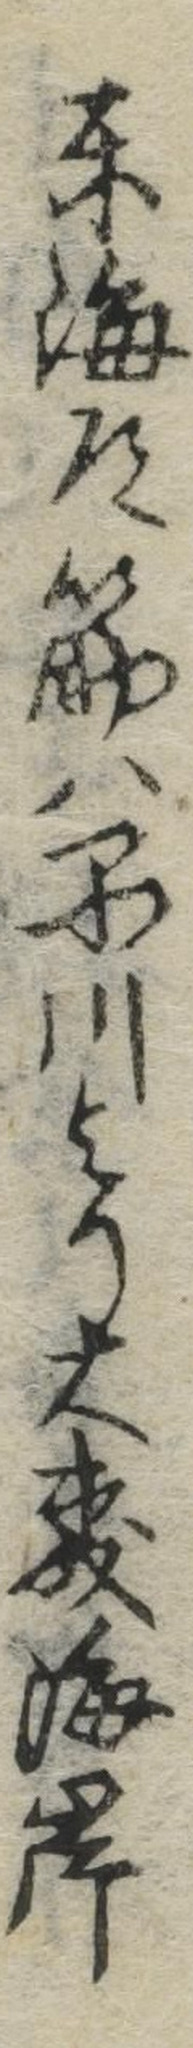東海道筋ハ品川より大森海岸
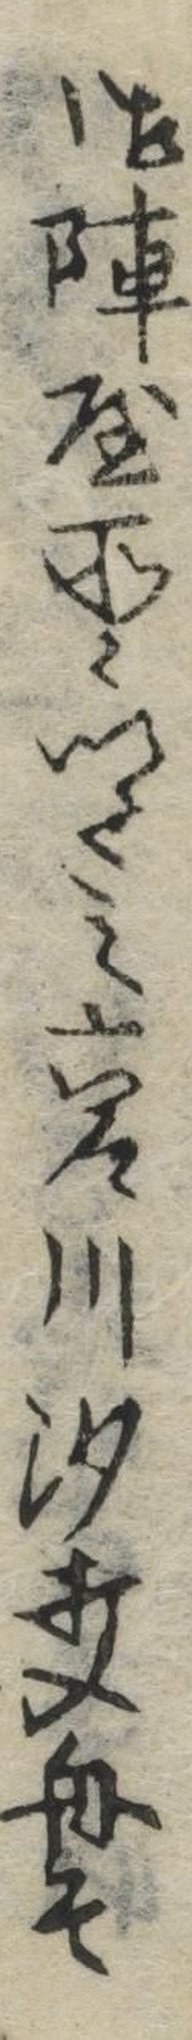御陣屋所〻いたミ六郷川汐打入舟そ
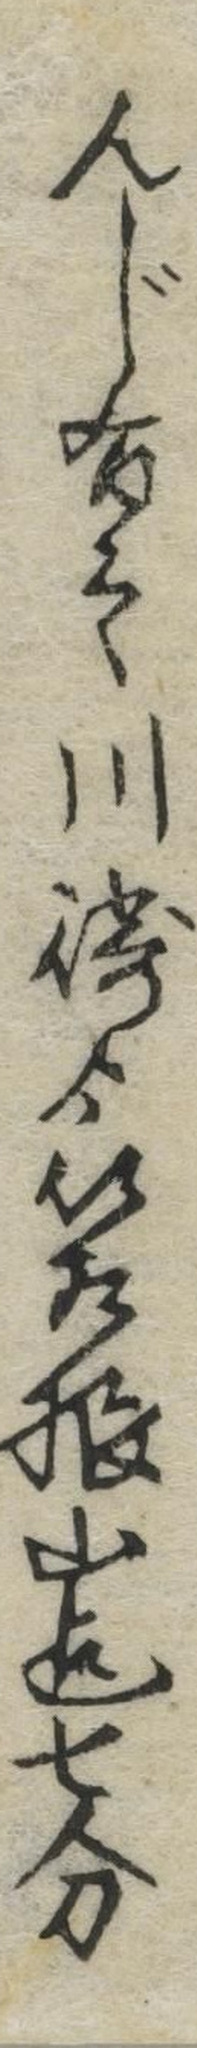んじ有之川崎ゟ箱根山迄七分
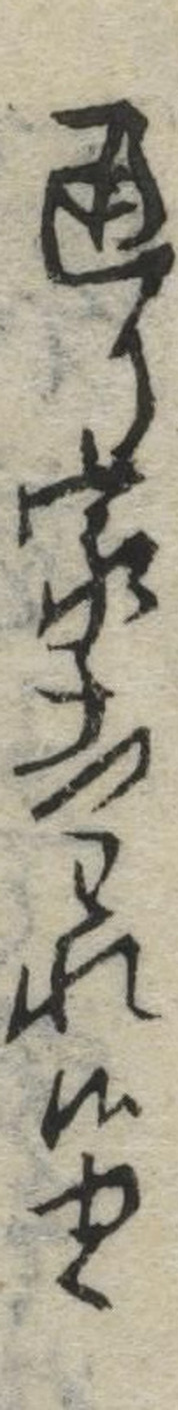通り家こわれ候由
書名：安政三年辰八月廿五日夜　大江都御屋敷方寺社市中共　大嵐水入場所明細書之寫　并街道筋近郷聞書
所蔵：東京大学地震研究所図書室 Earthquake Research Institute Library, The University of Tokyo, JAPAN
